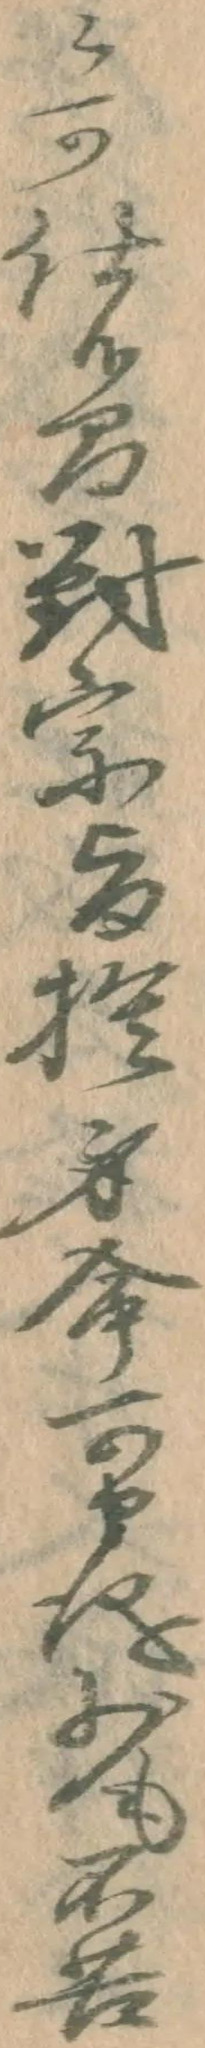に可仕候間対宗旨捨身命可申儀少も不苦
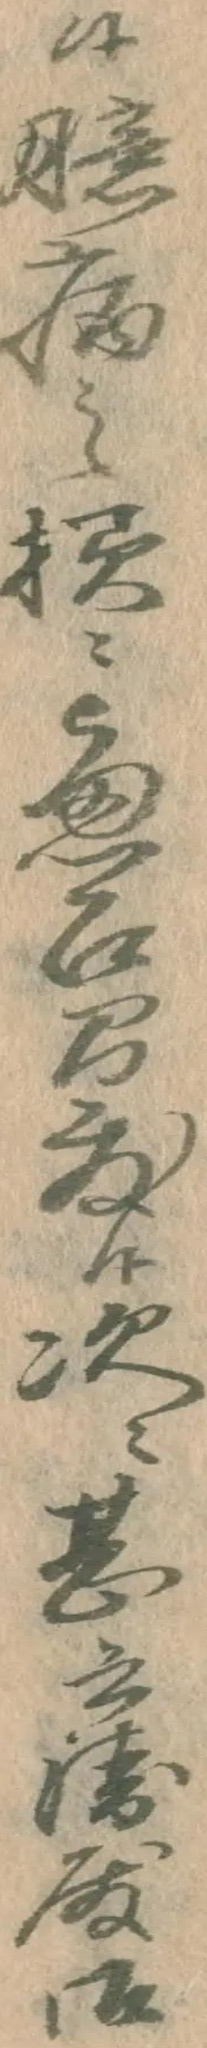候臆病之様に被思召間敷候次に甚兵衛殿御
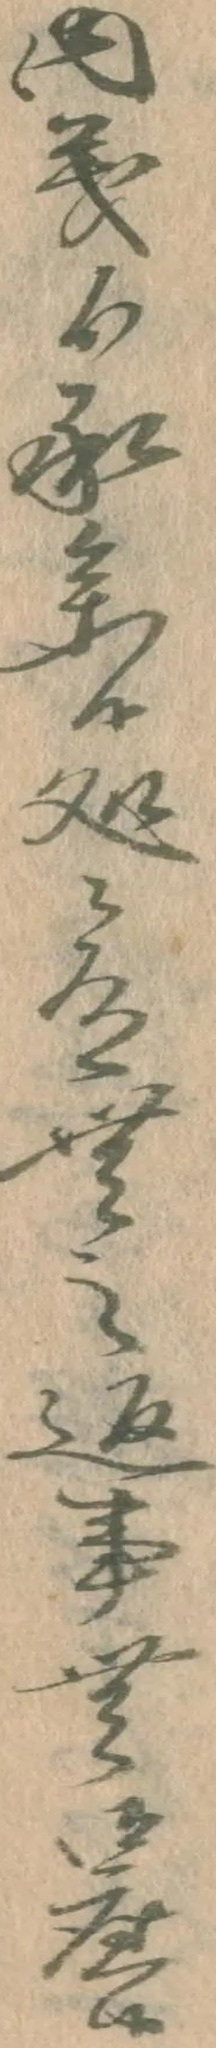聞義ゟ承参候処に有無之返事無御座候
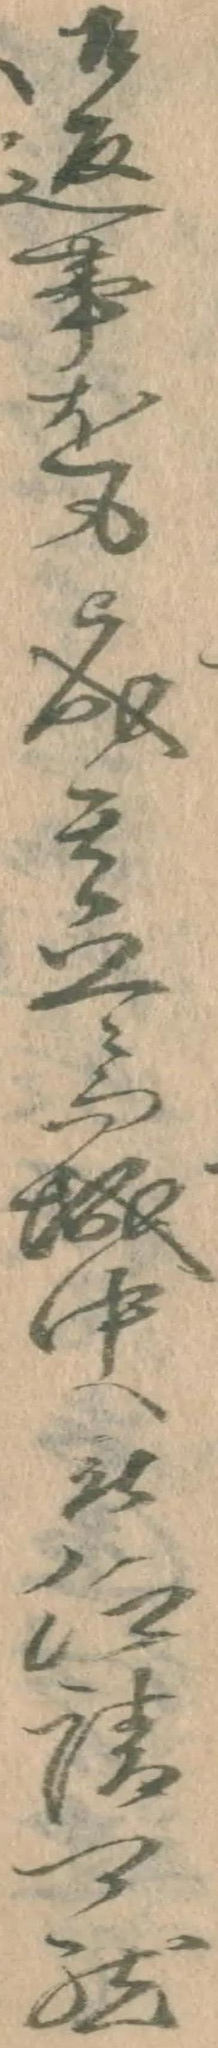御返事をも被成其上に而城中へ被仰請可然
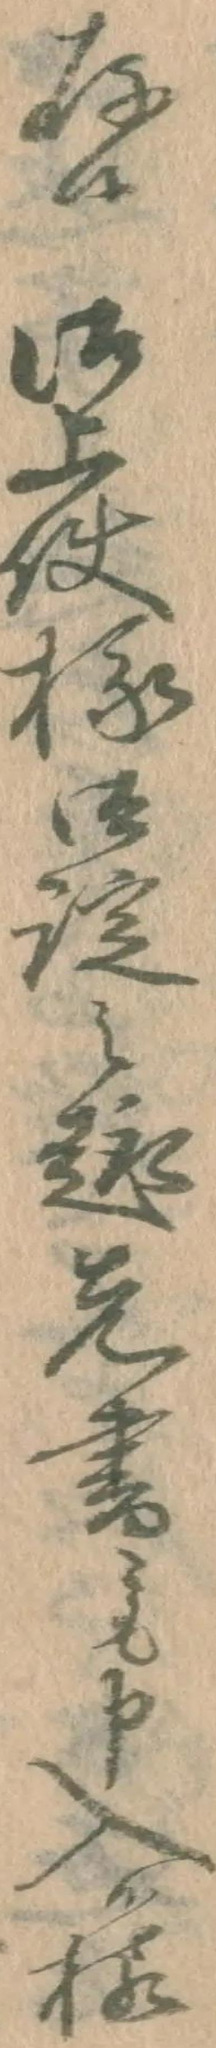存候御上使様御諚之趣先書にも申入候様
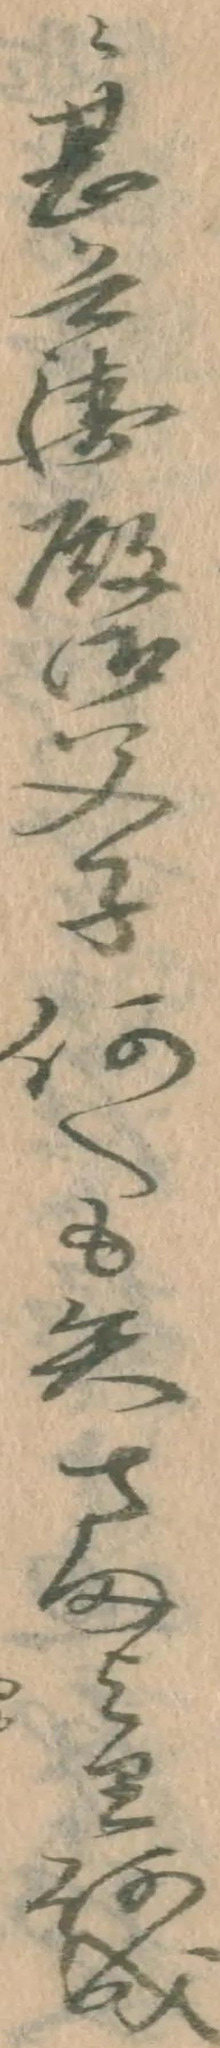に甚兵衛殿御父子何へも矢さ多与里何成
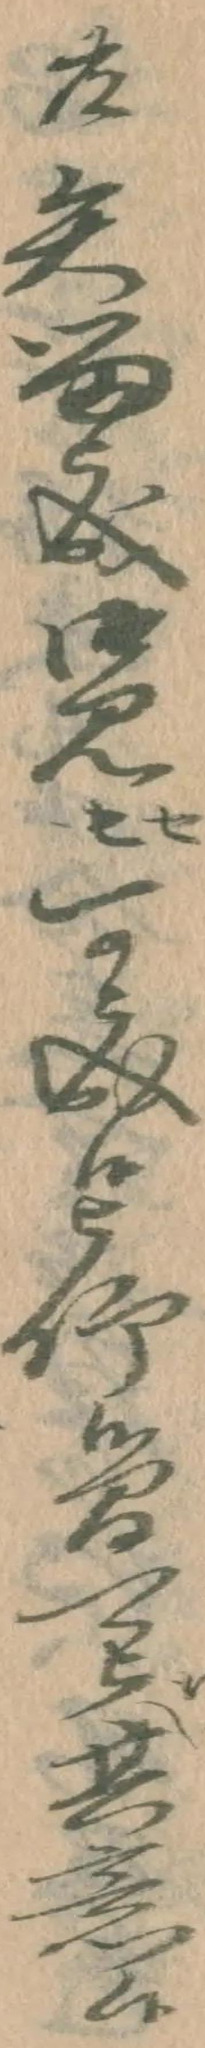共矢留被成御見せ可被成候被仰候間可被得其意候
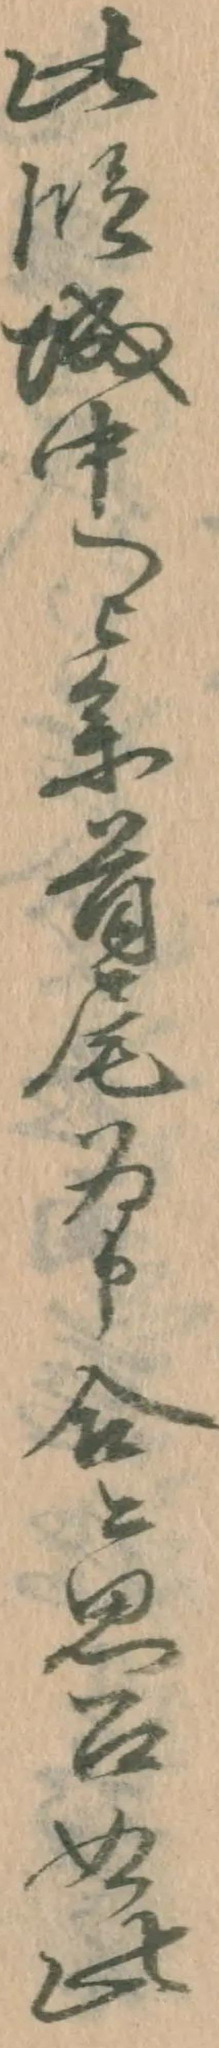此段城中へ与参首尾為申合と思召如此
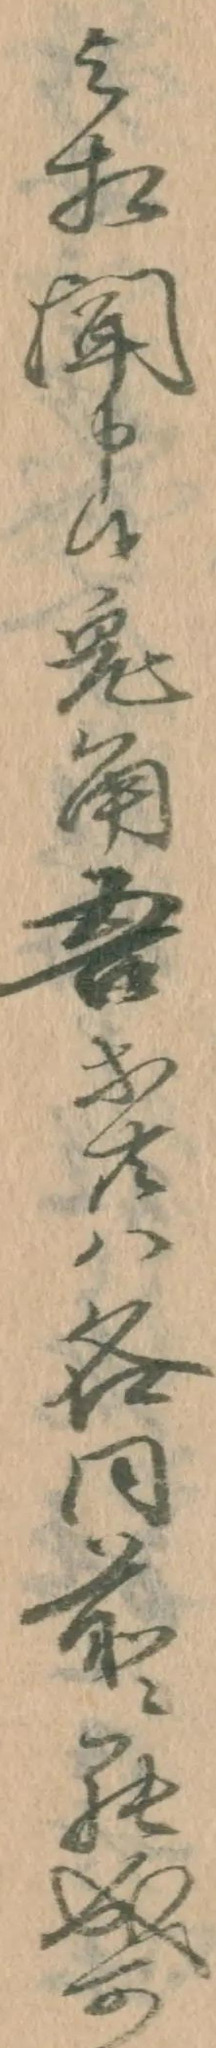与相聞申候兎角吾等共は各同前に罷成可
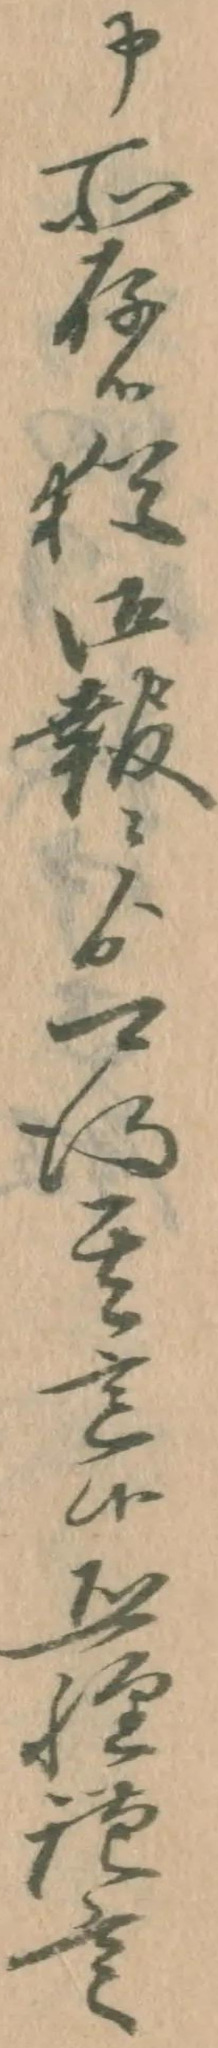申所存候猶御報にゟ可得其意候恐惶謹言
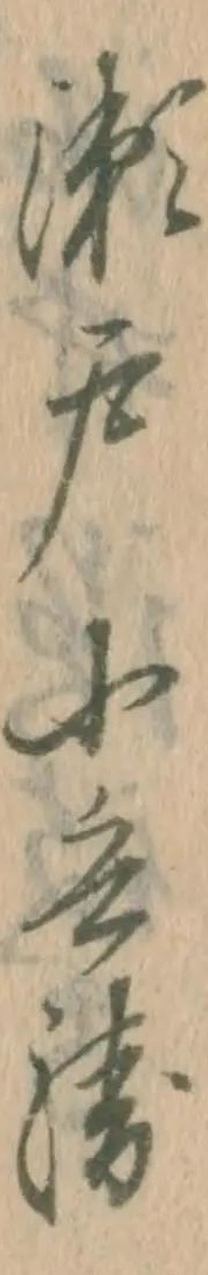瀬戸小兵衛
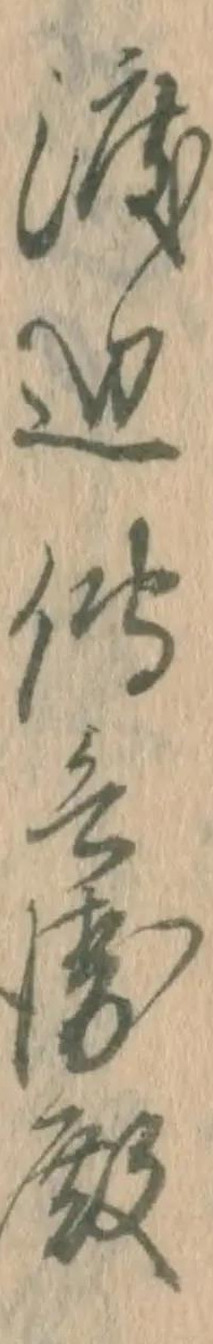渡辺伝兵衛殿
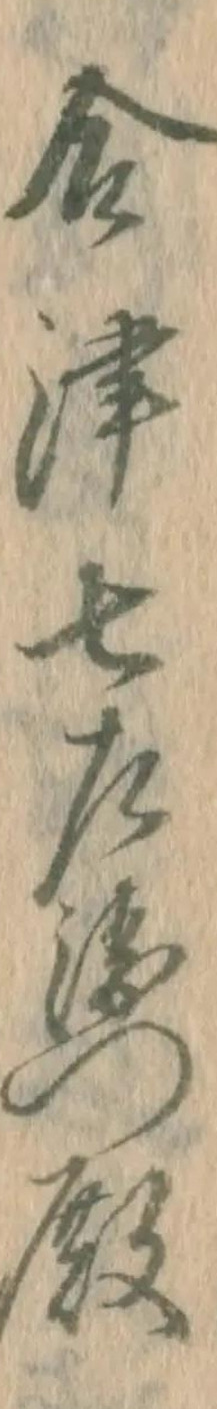合津七左衛門殿
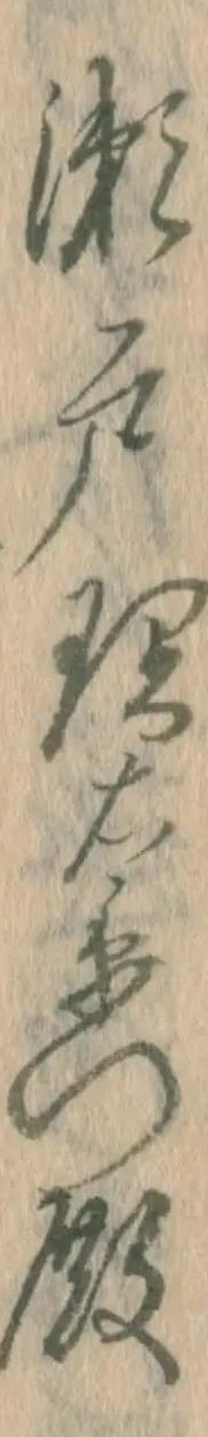瀬戸理右衛門殿
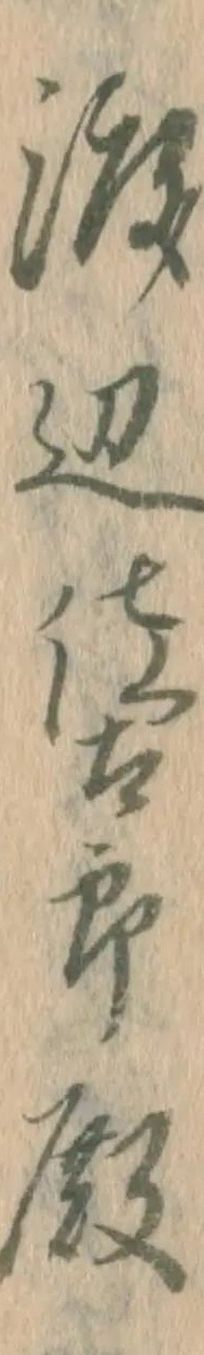渡辺佐太郎殿
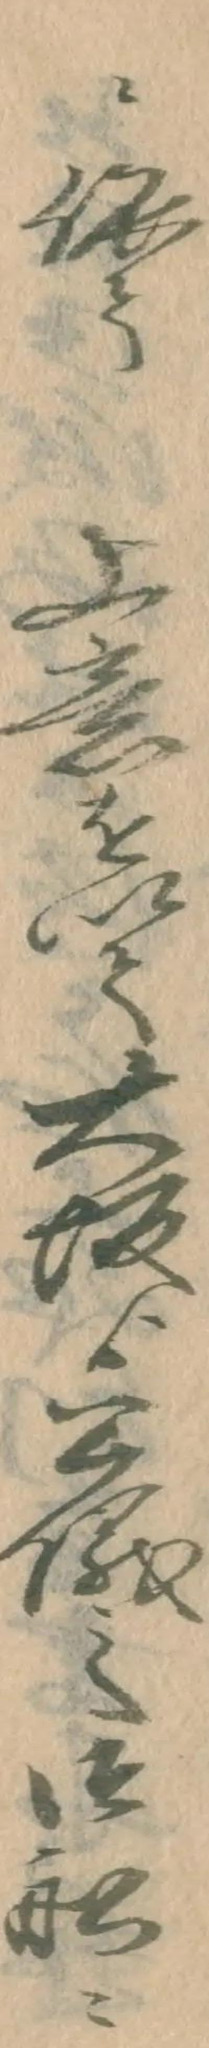に依て上意を以て大坂ゟ公儀之御舩に
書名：切支丹御退治記 49巻. [6]
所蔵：国立国会図書館 National Diet Library, JAPAN
